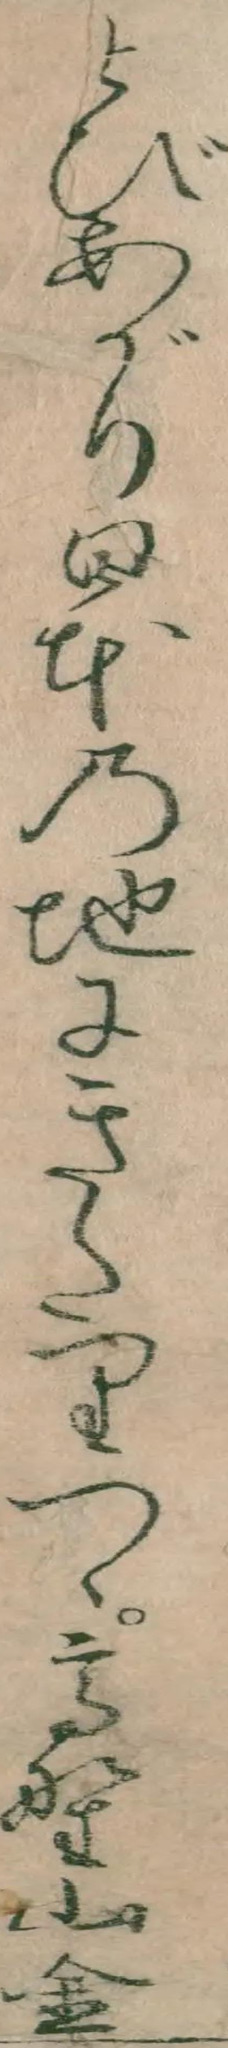とびあがり日本の地にきたりつゝ。高野山金
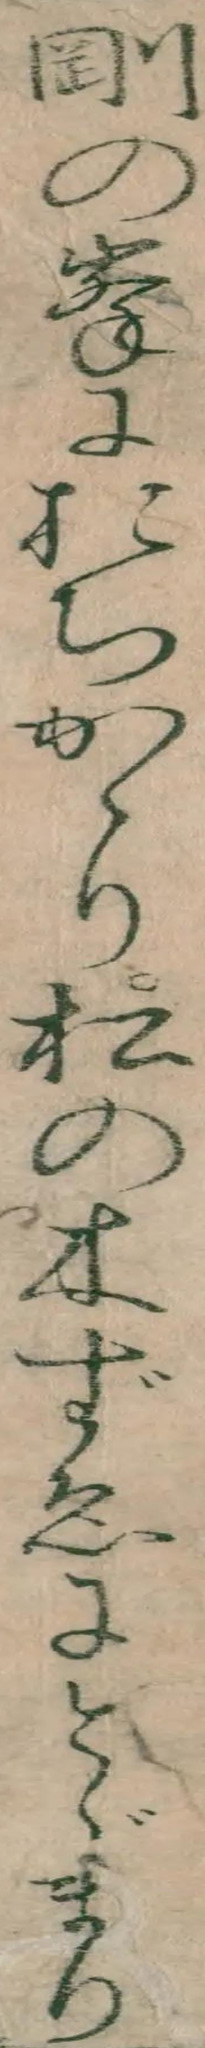剛の峯におちかゝり。松の木ずゑにとゞまり
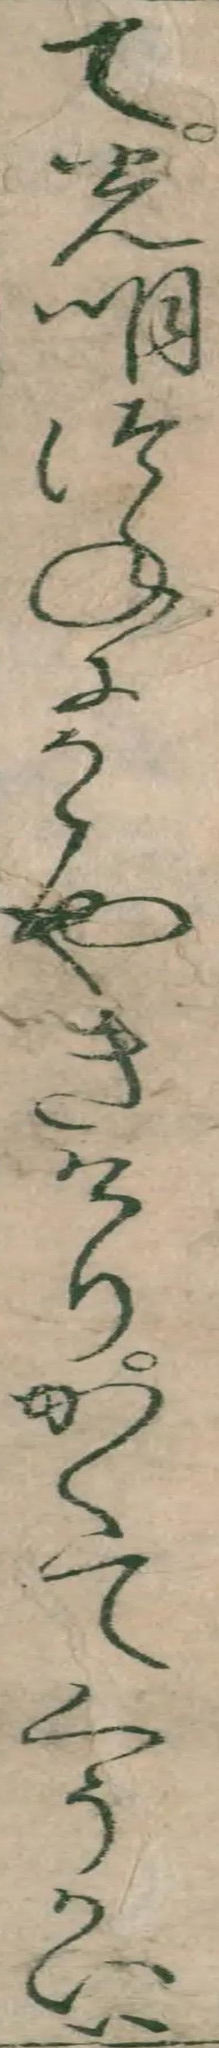て。光明つねにかゝやきけり。かくてくうかいは

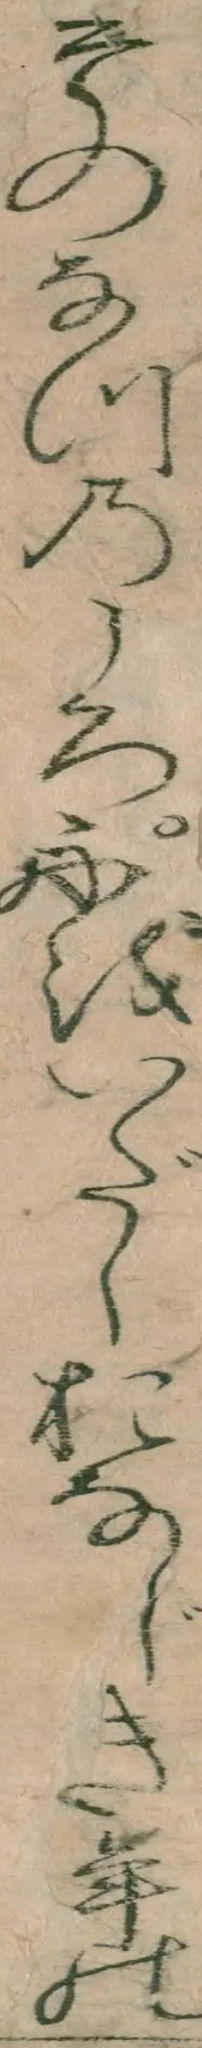そのなつのころ。舟をいだしおなじき年の
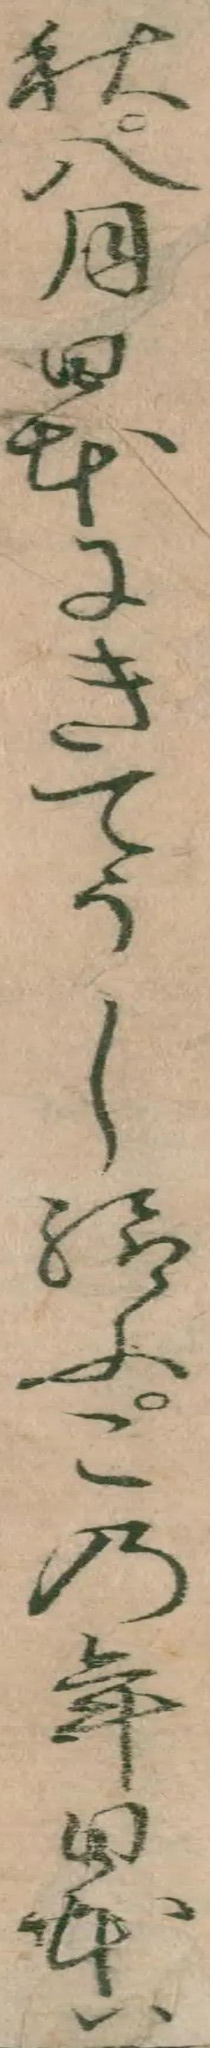秋。八月日本にきてうし給ふ。この年日本は
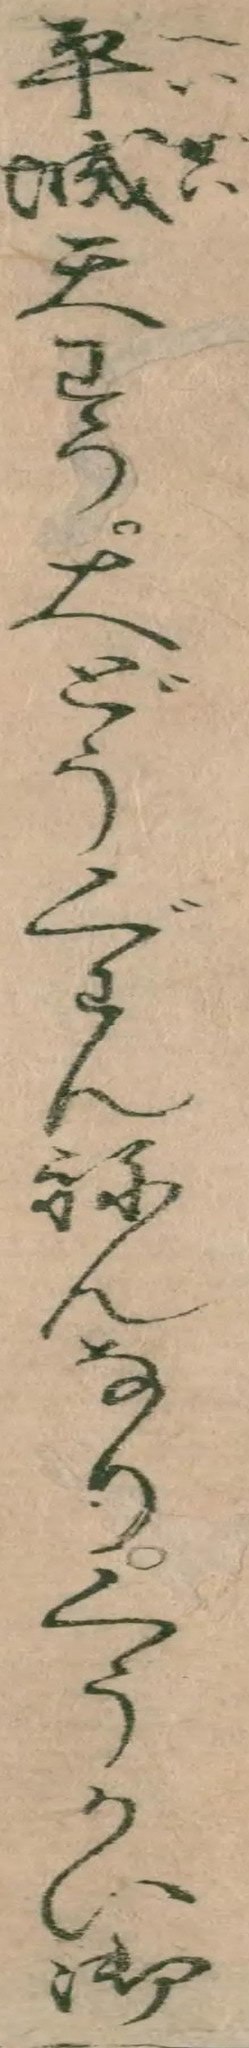平城天わう。大どうぐわんねんなり。くうかい御
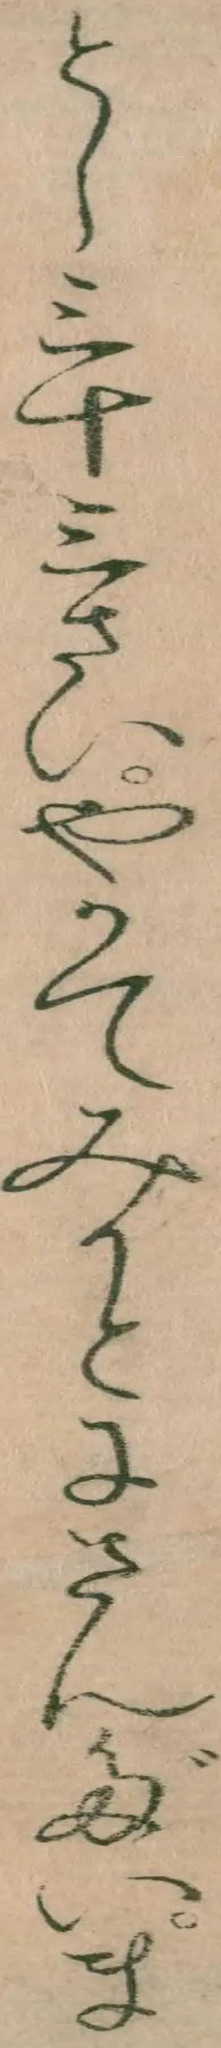とし三十三さい。やかてみかとにさんだい。ま
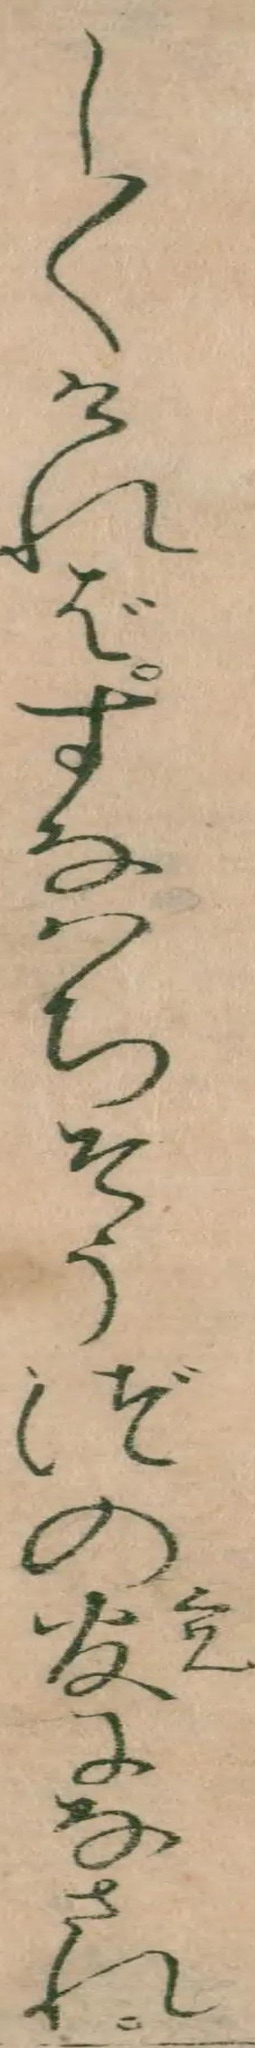し〳〵ければ。すなはちそうづの官になされ。
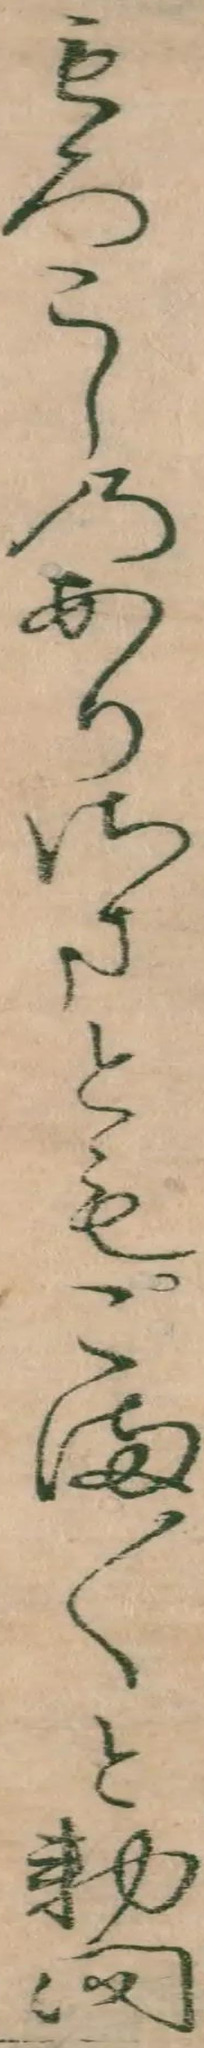もろこしのありさまとも。こま〳〵と勅問
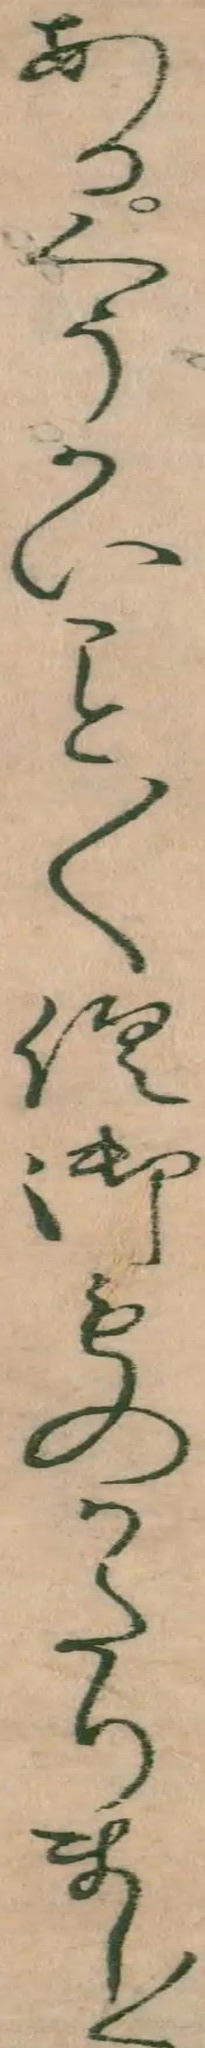ある。くうかいこと〳〵く御ものかたりまし〳〵
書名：弘法大師御本地 3巻. [1]
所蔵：国立国会図書館 National Diet Library, JAPAN
